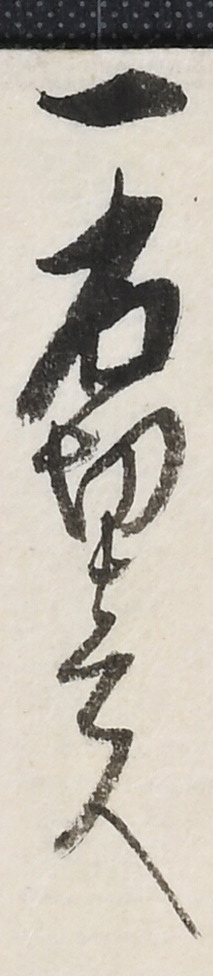一石切壱人
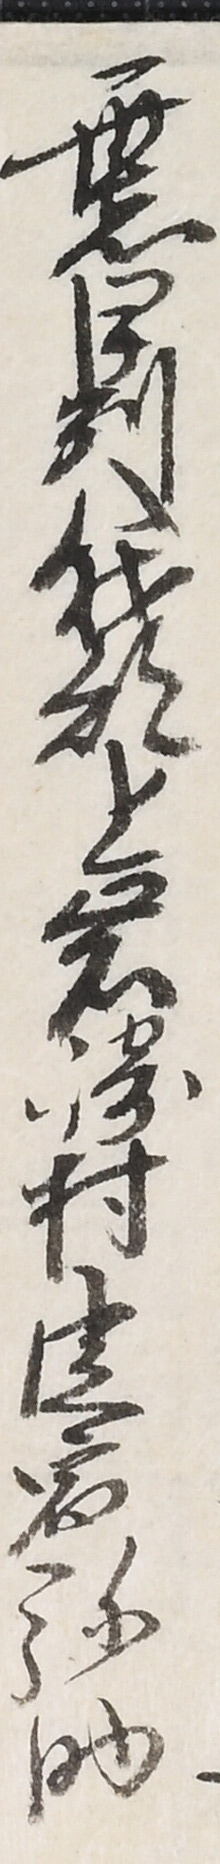此者甲州八代郡上岩崎村定宿弥助
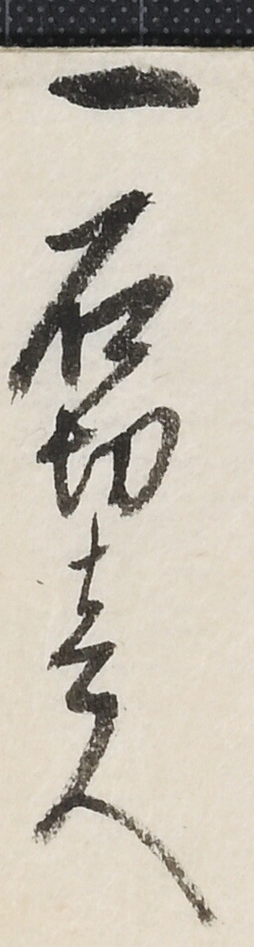一石切壱人
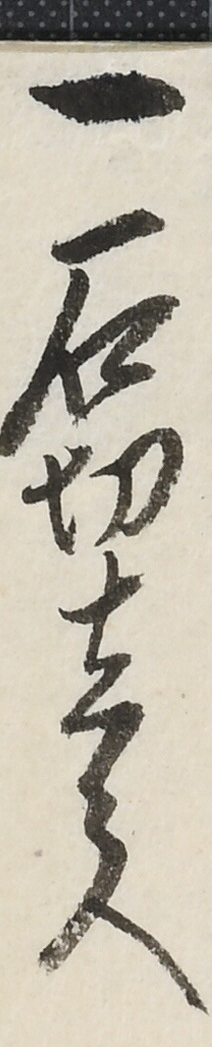一石切壱人
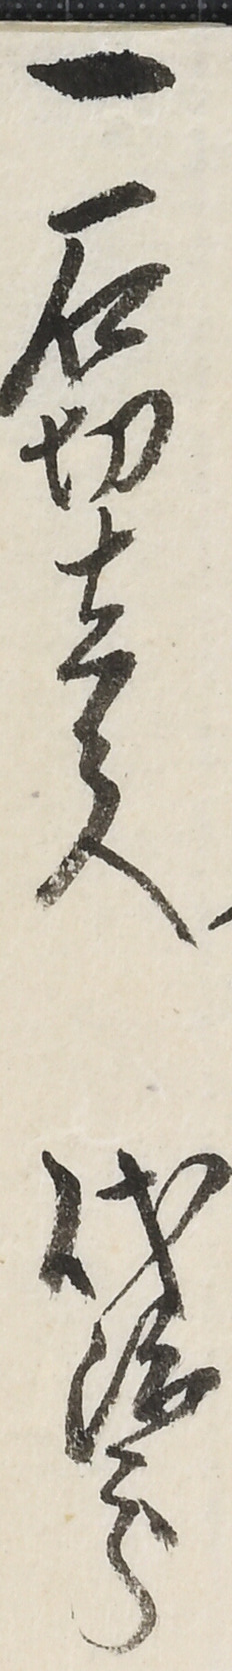一石切壱人代治郎
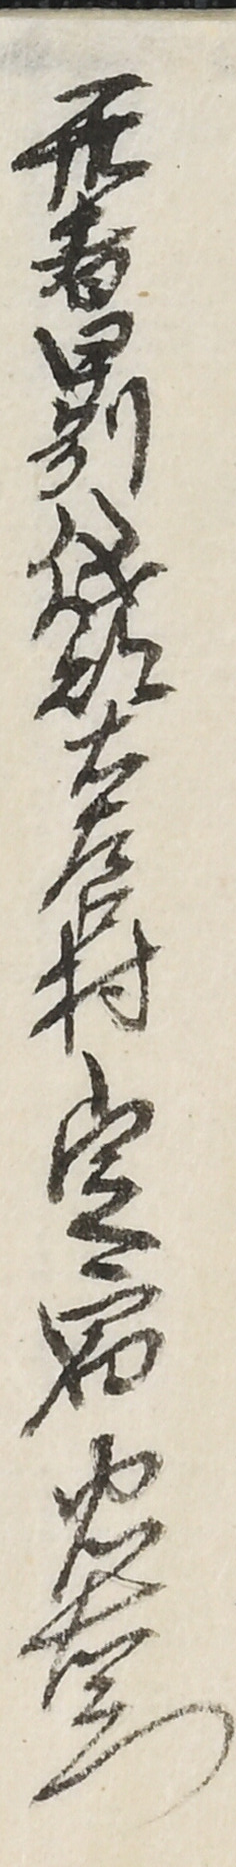此者甲州八代郡右左口村定宿忠右衛門
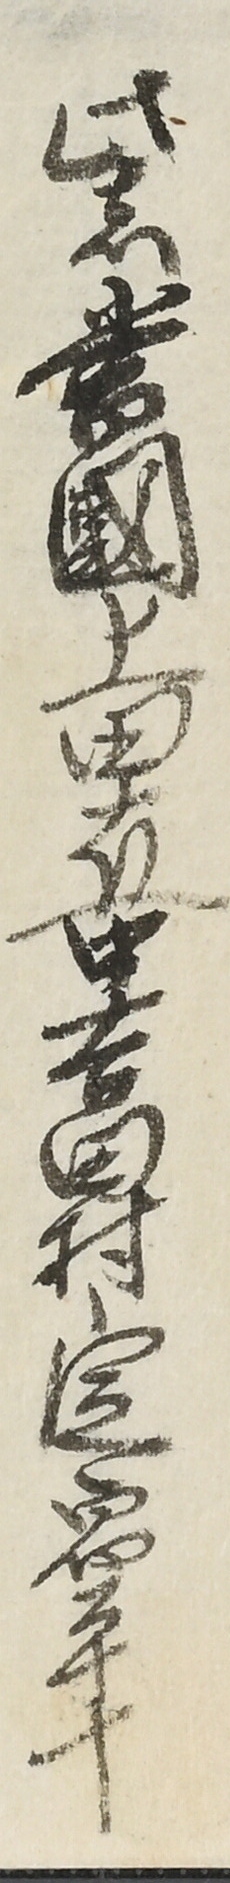此者当国上田在中吉田村定宿平十
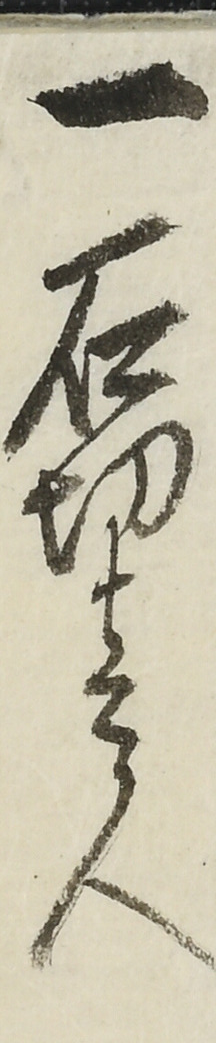一石切壱人
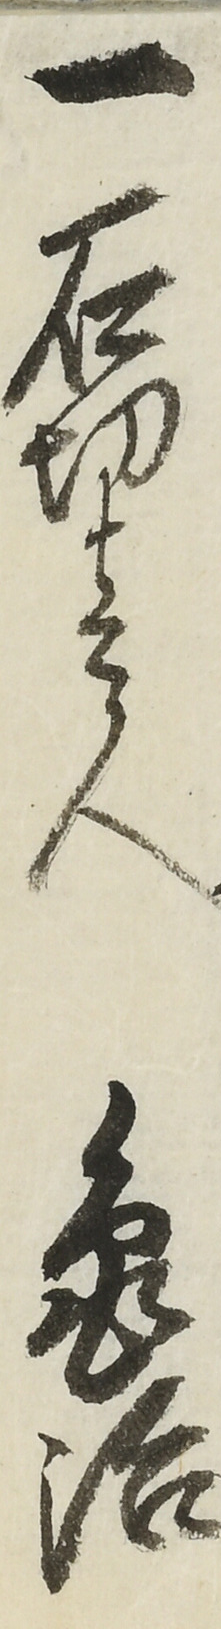一石切壱人代治郎
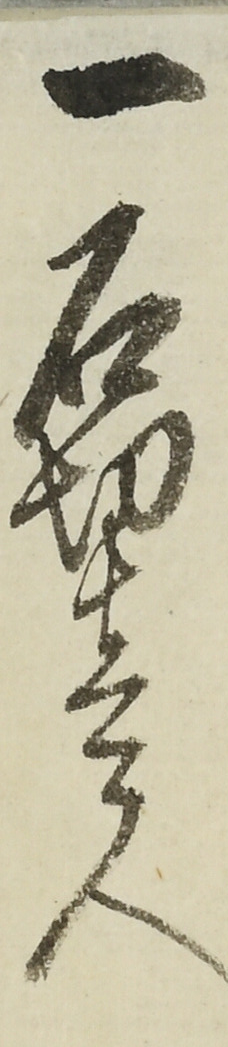一石切壱人
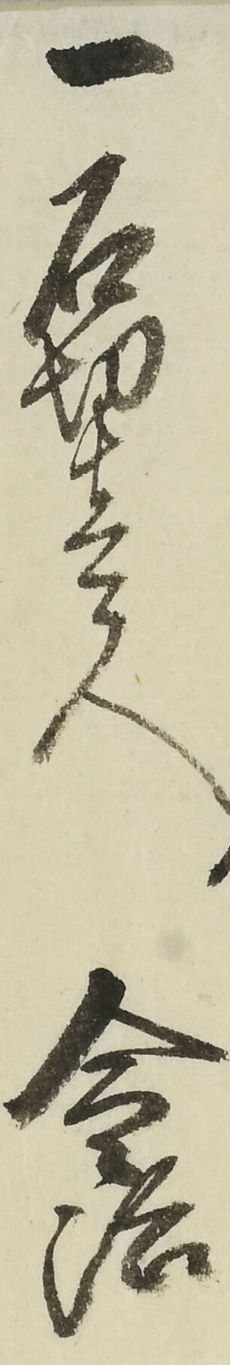一石切壱人代治郎

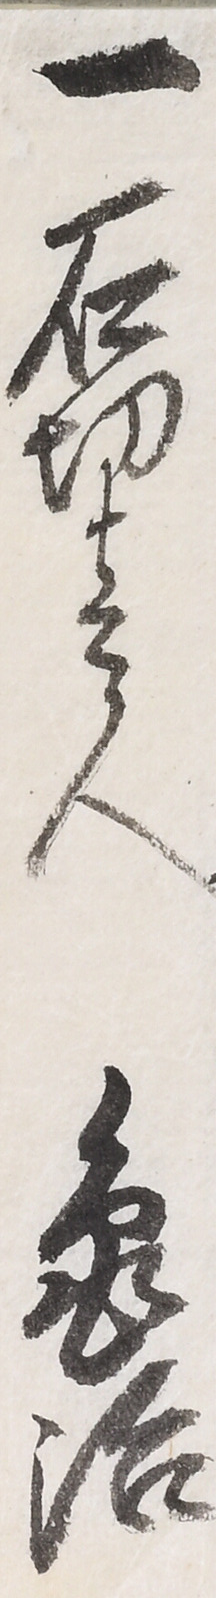一石切壱人亀治
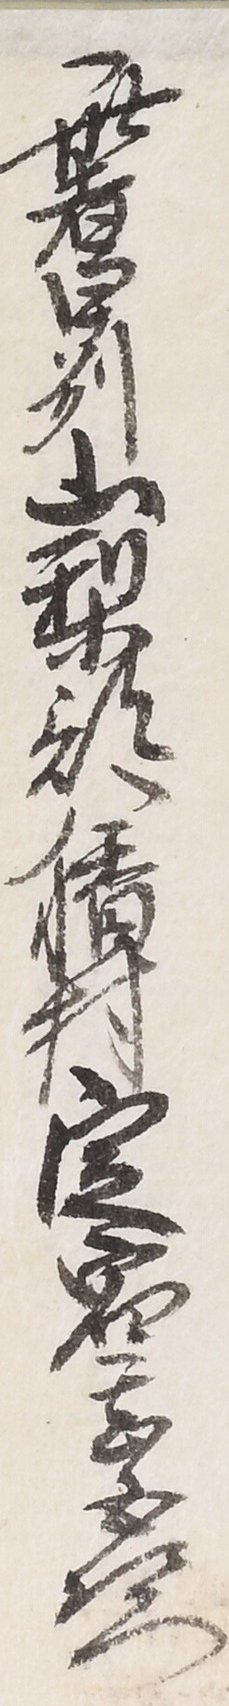此者甲州山梨郡八幡村定宿甚五左衛門
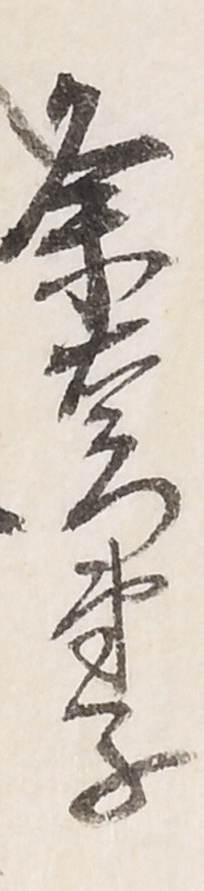粂右衛門弟子
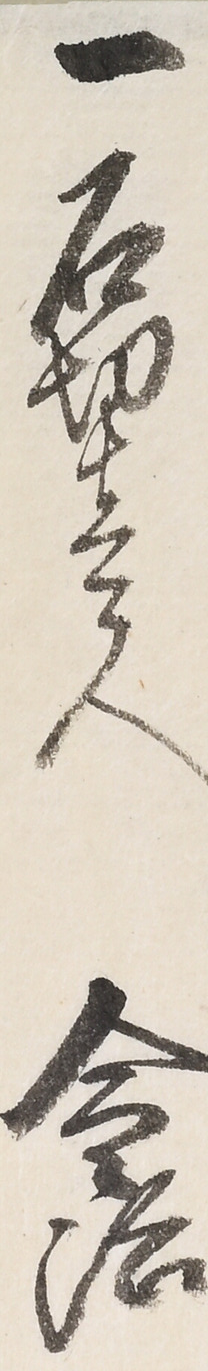一石切壱人金治
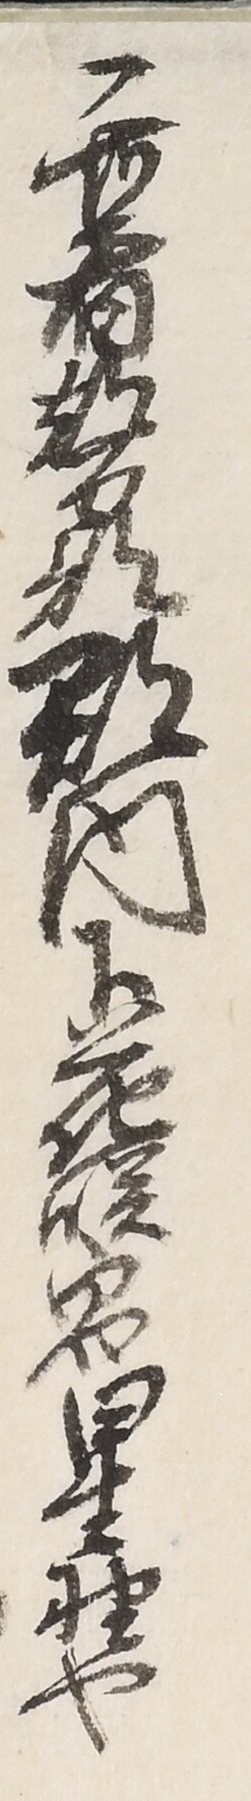此者都留郡郡内下花咲宿星野や
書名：安政六己未年二月石切名前書上帳
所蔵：伊那市立高遠町図書館・合同会社AMANE
